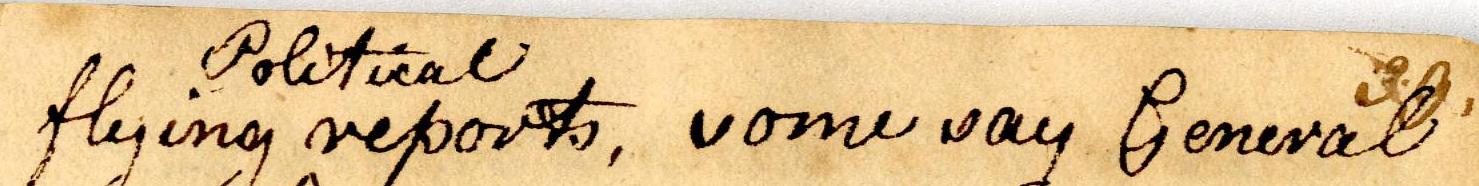flying ^ reports, some say General
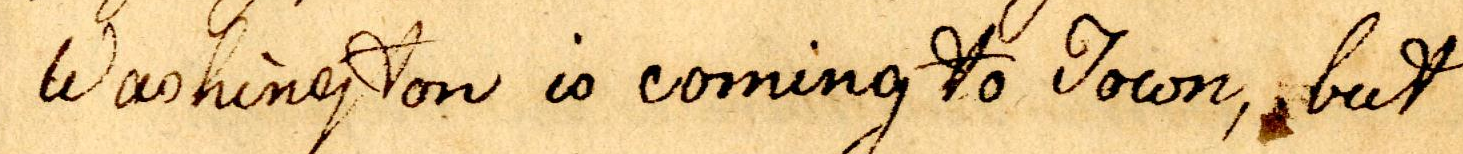Washington is coming to Town, but
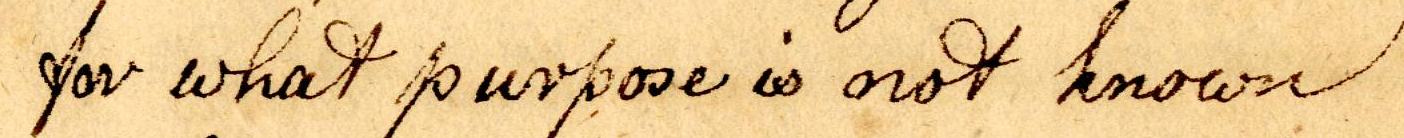for what purpose is not known
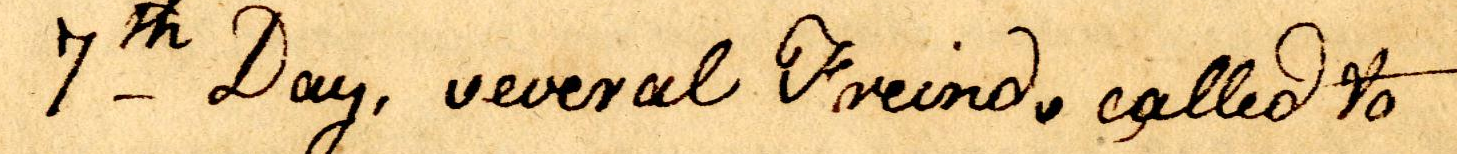7^th Day, several Friends, called to
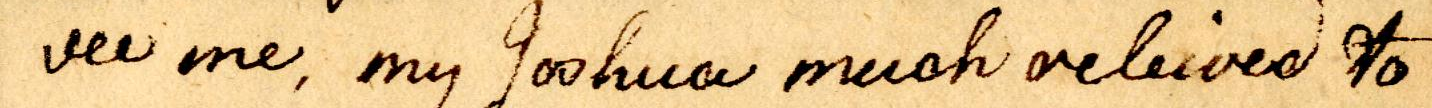see me, my Joshua much releived to
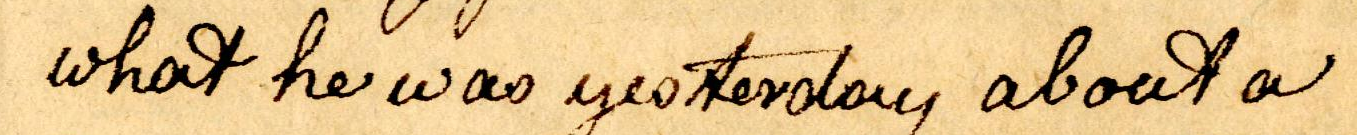what he was yesterday about a
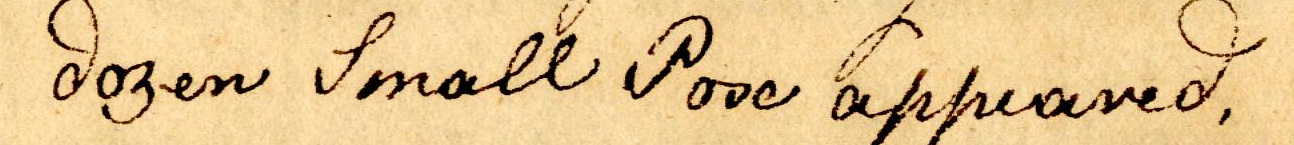dozen Small Pox appeared,
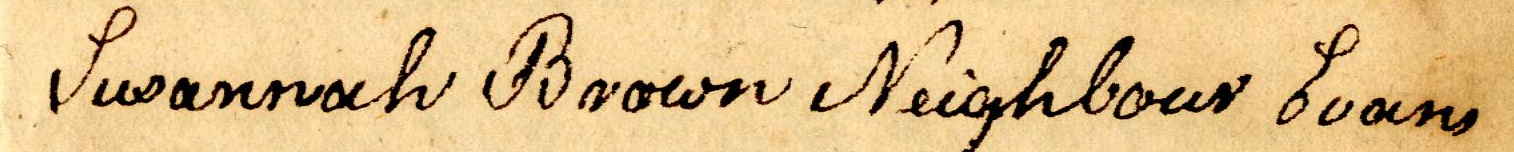Susannah Brown Neighbor Evans
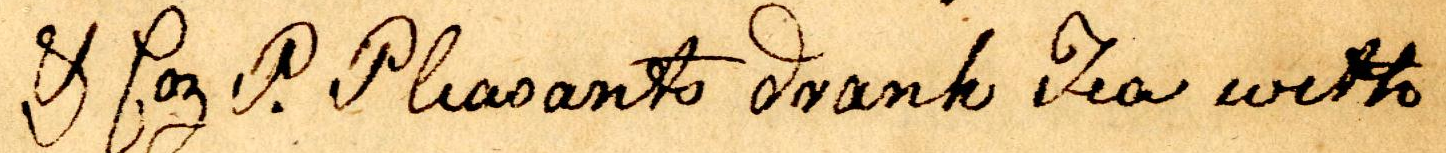& Coz P. Pleasants Drank Tea with
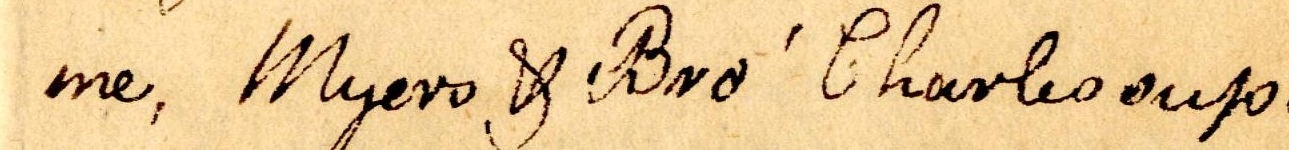me, Myers & Bro' Charles supd
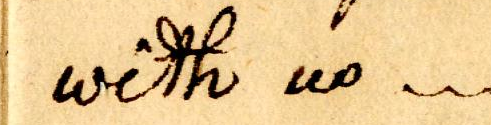with us -
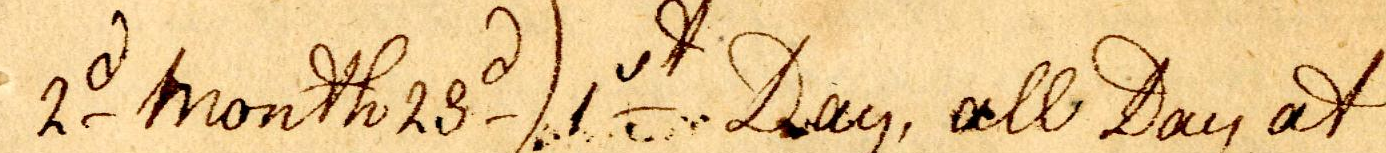2^d Month 23^d) 1^st Day, all Day at
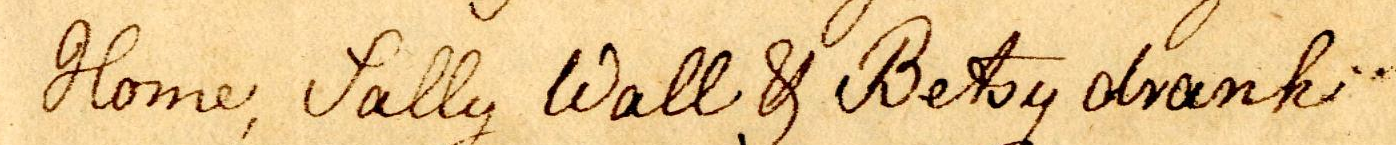Home, Sally Wall & Betsy drank
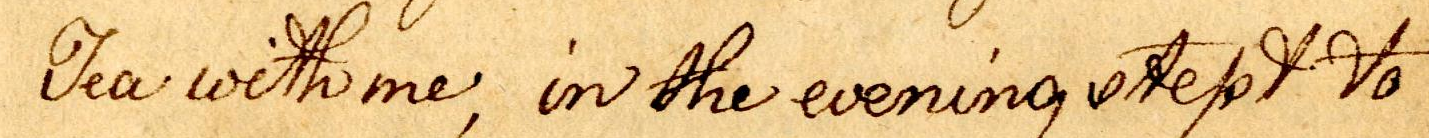Tea with me, in the evening stept to
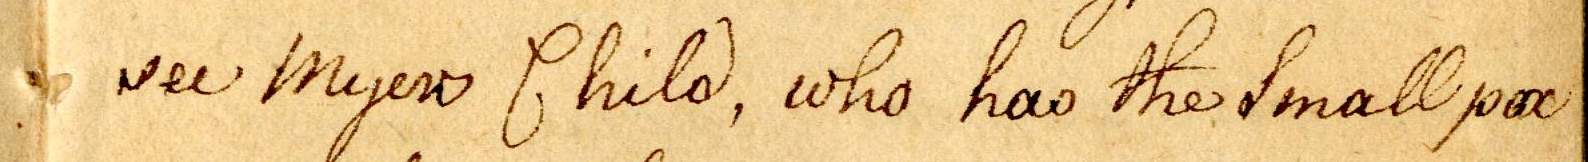see Myers Child, who has the Small pox
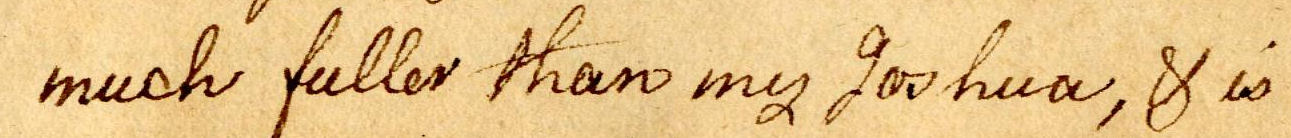much fuller than my Joshua, & is
